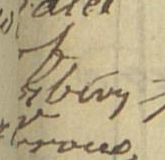-bury
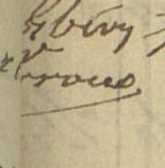-rous
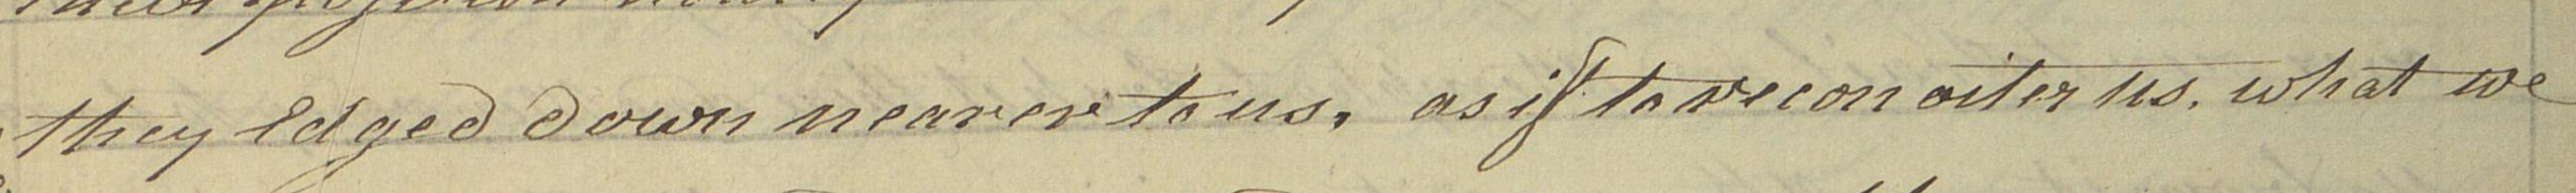they Edged down nearer to us, as if to reconoitor us, what we
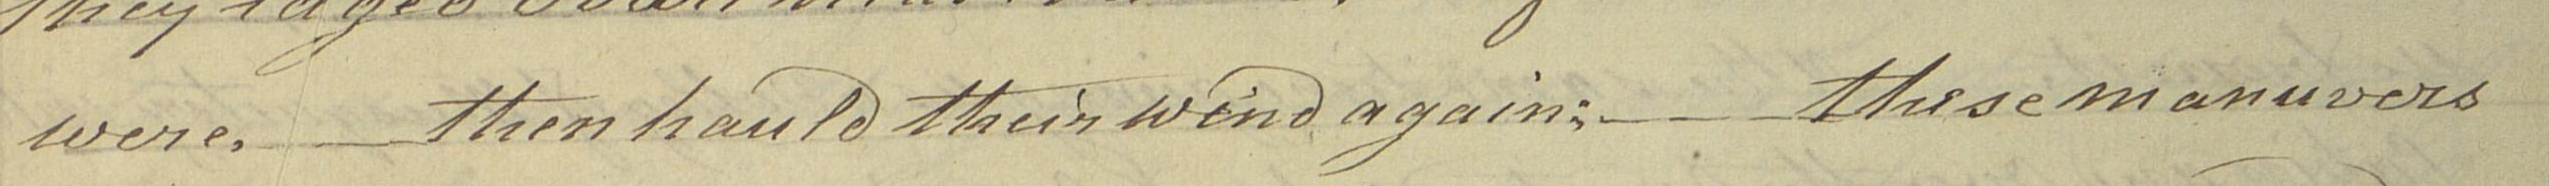were. then hauld their wind again; these manuvers
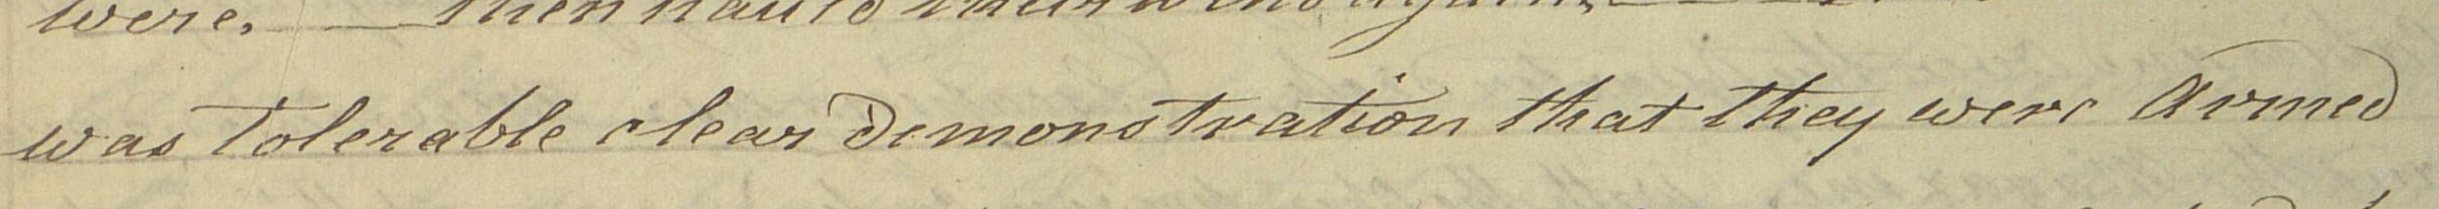was tolerable clear demonstration that they were armed
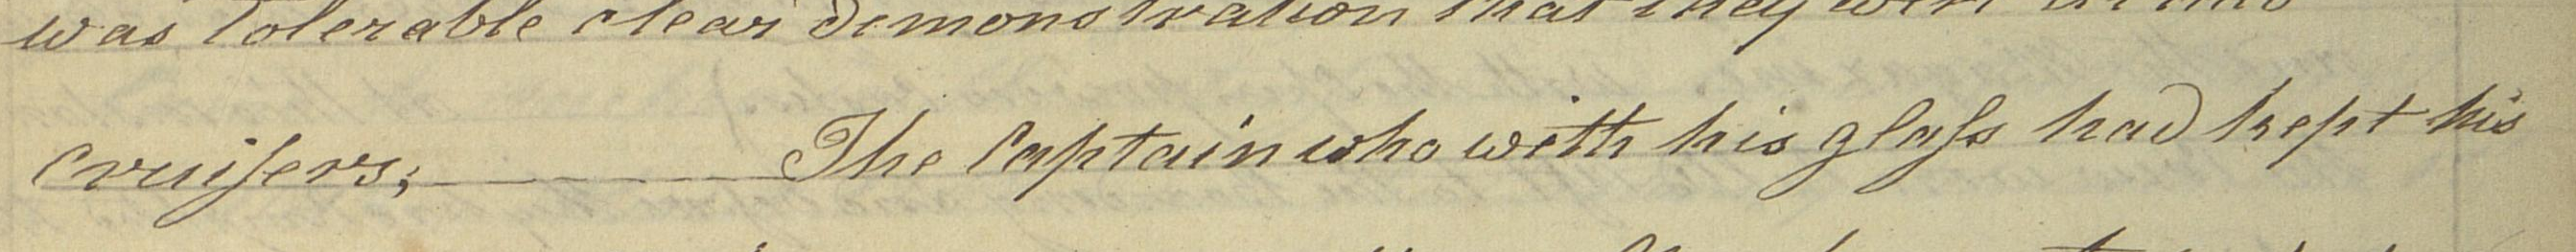cruisers, The Captain who with his glass had kept his
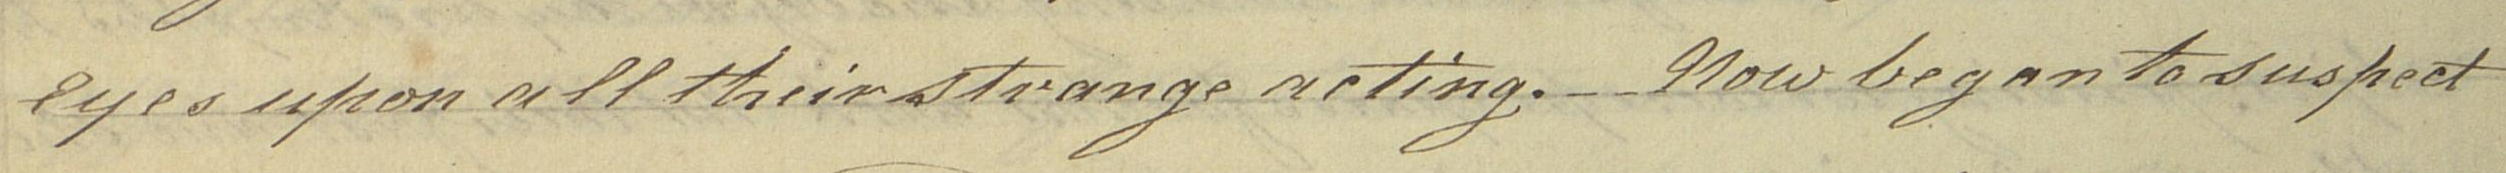eyes upon all their strange acting. Now began to suspect
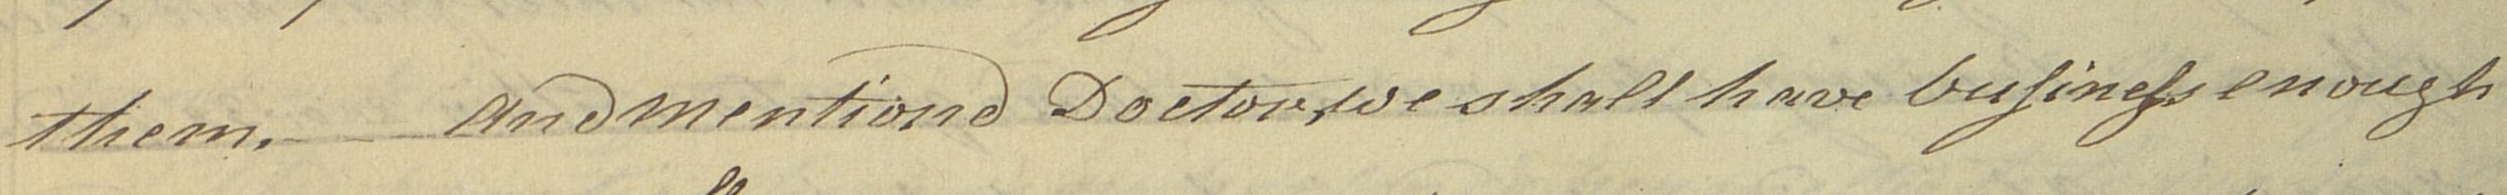Them. And mentiond Doctor, we shall have business enough
